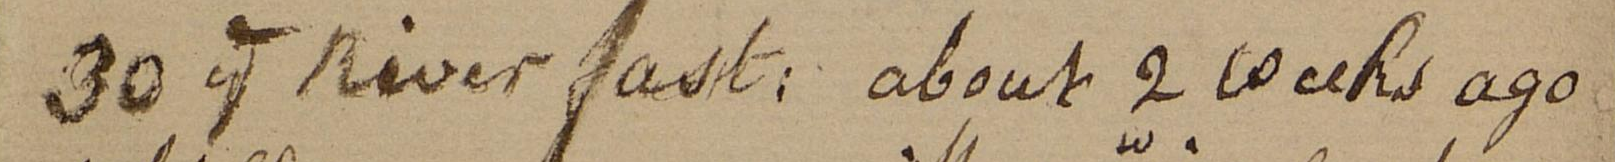30 y^e River fast: about 2 Weeks ago
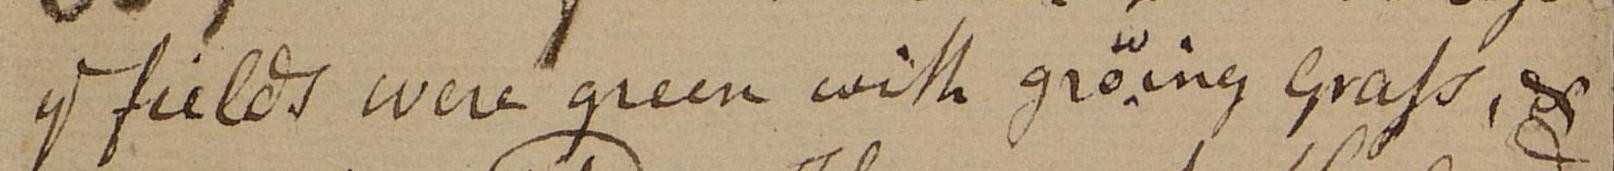y^e fields were green with gro ^w ing Grass, &
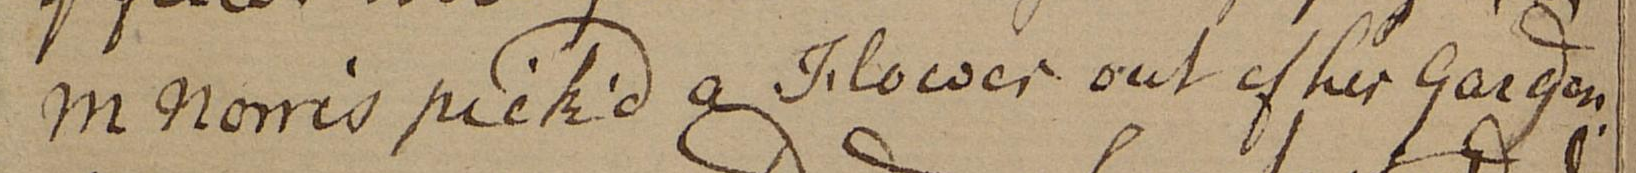M Norris pick'd a Flower out her Garden,
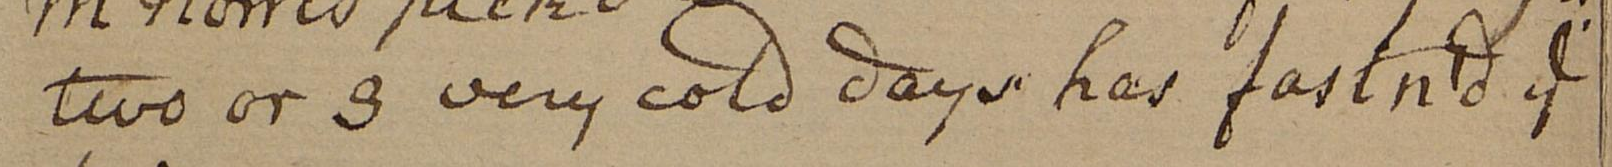two or 3 very cold days has fastn'd y^e
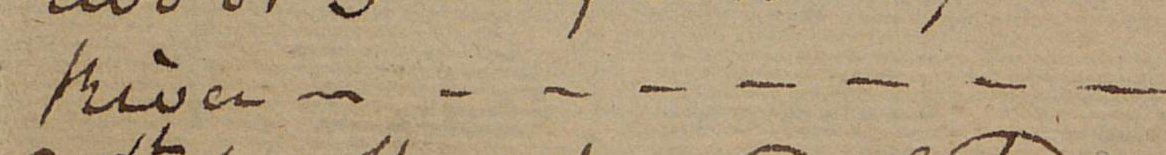River--- - --
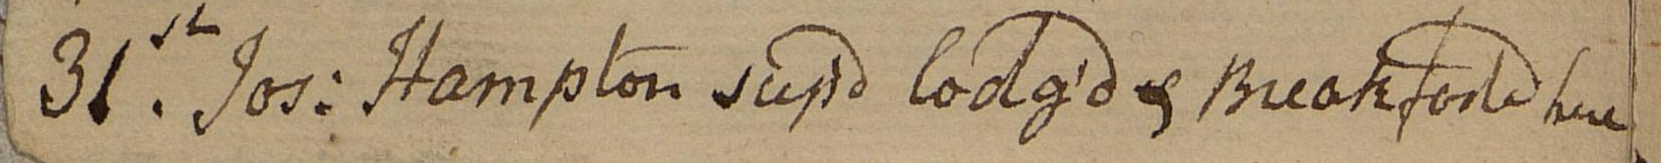31^st. Jos: Hampton sup'd lodg'd & Breakfastd here
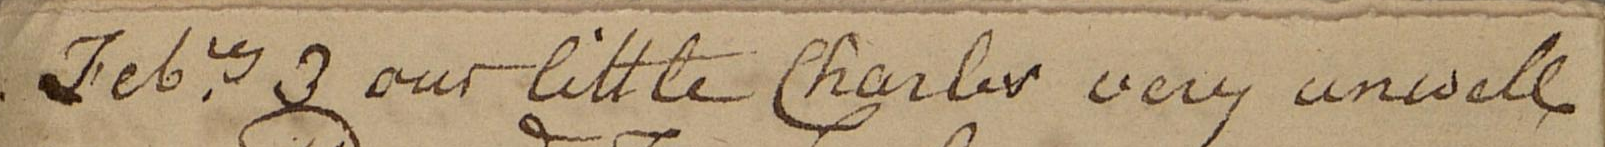Feb^ry 3 our little Charles very unwell
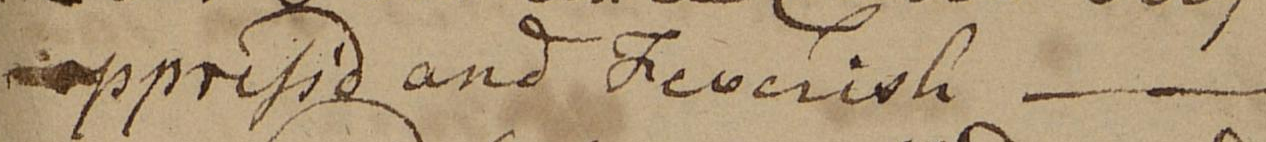oppress'd and Feverish--
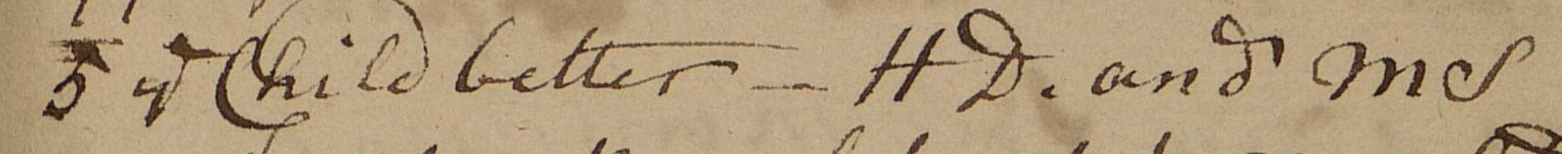5 y^e Child better- HD. and MS
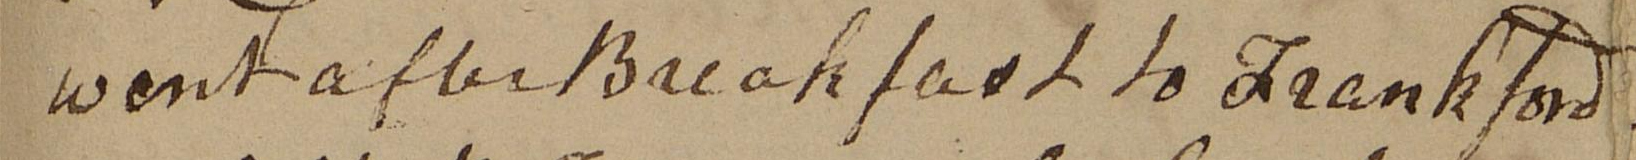went after Breakfast to Frankford
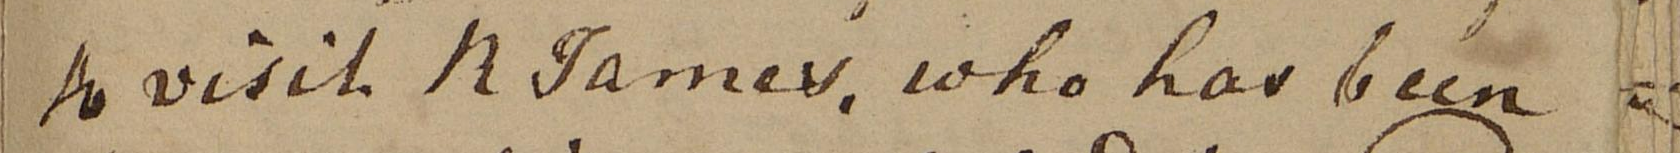to visit R James, who has been
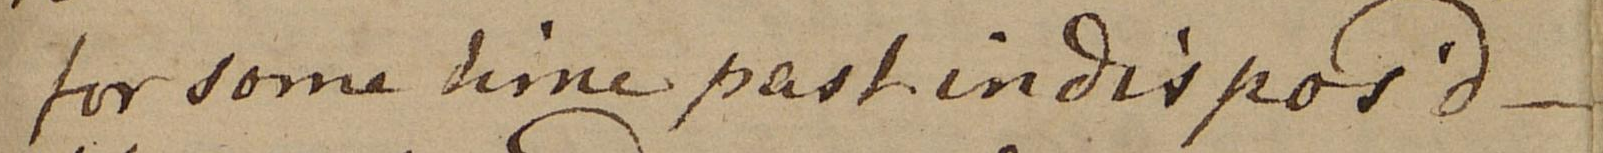for some time past indispos'd-
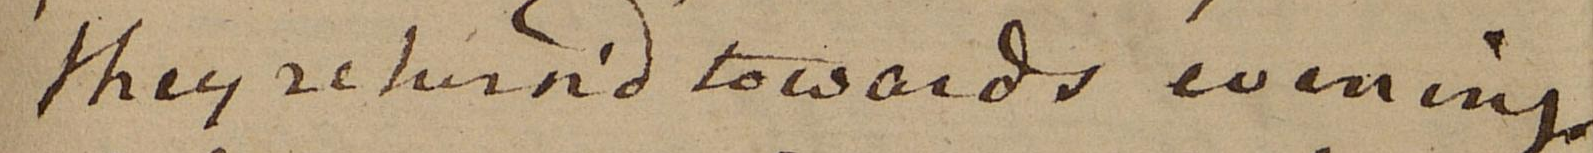they return'd towards evening
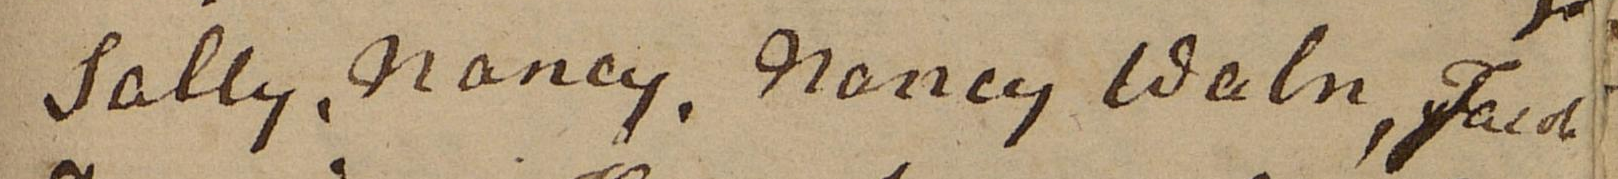Sally, Nancy, Nancy Waln, Jacob
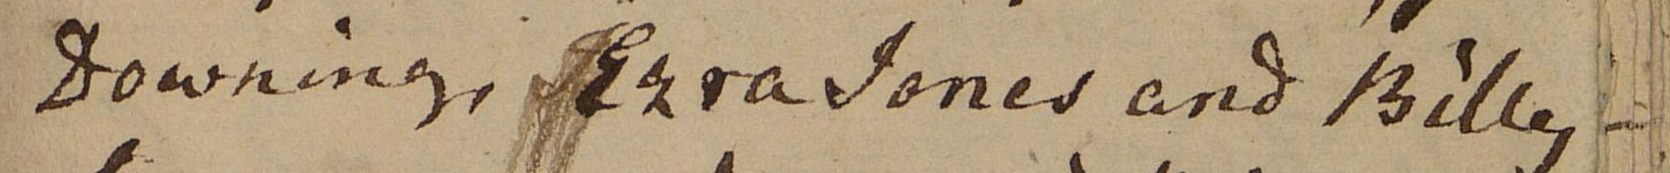Downing, Ezra Jones and Billy
